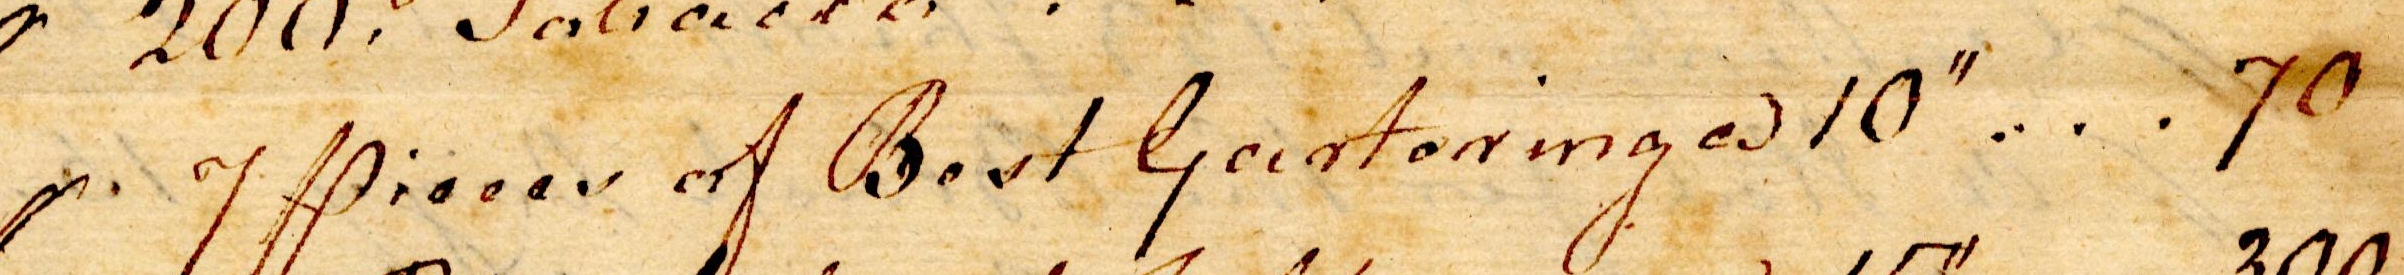7 pieces of best Gartering @ 10". . . 70
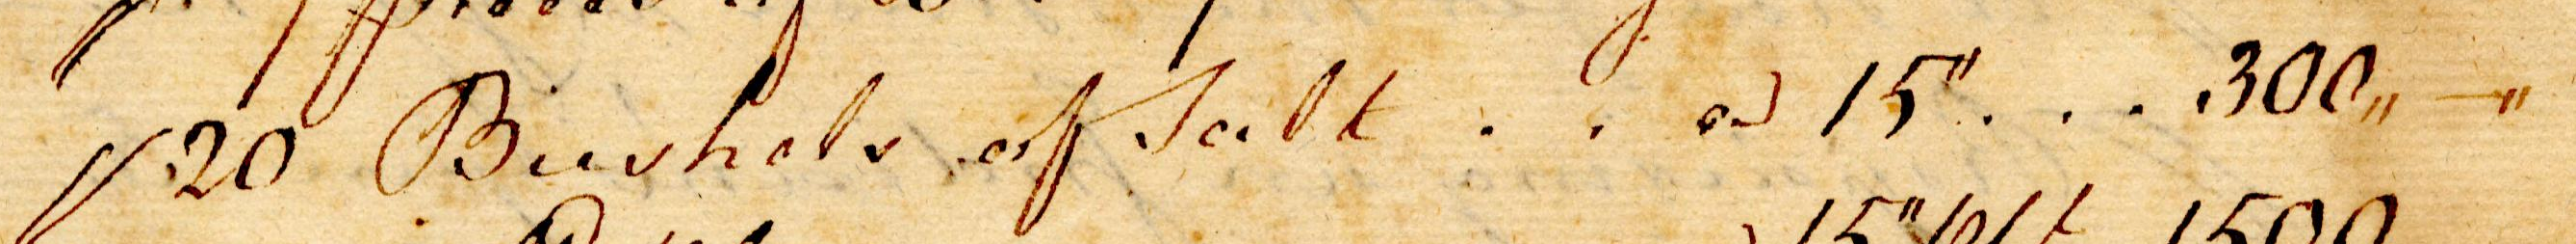20 Bushels of Salt.. .@ 15".. 300.-.
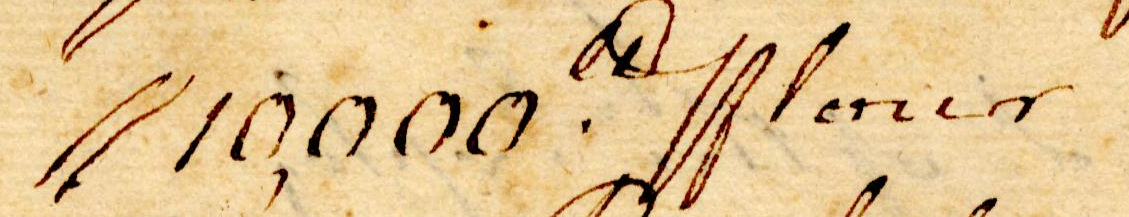10,000 ^lb flour
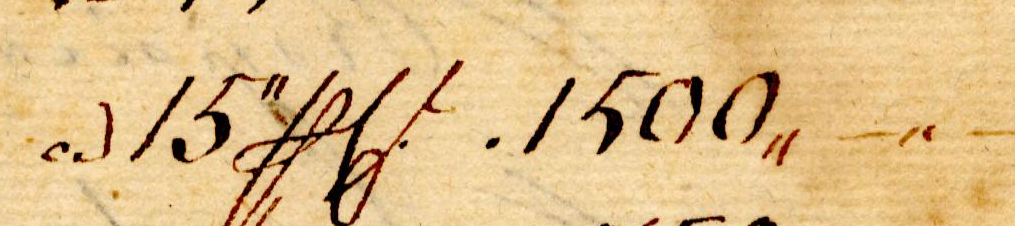@ 15 per C^t. 1500.-
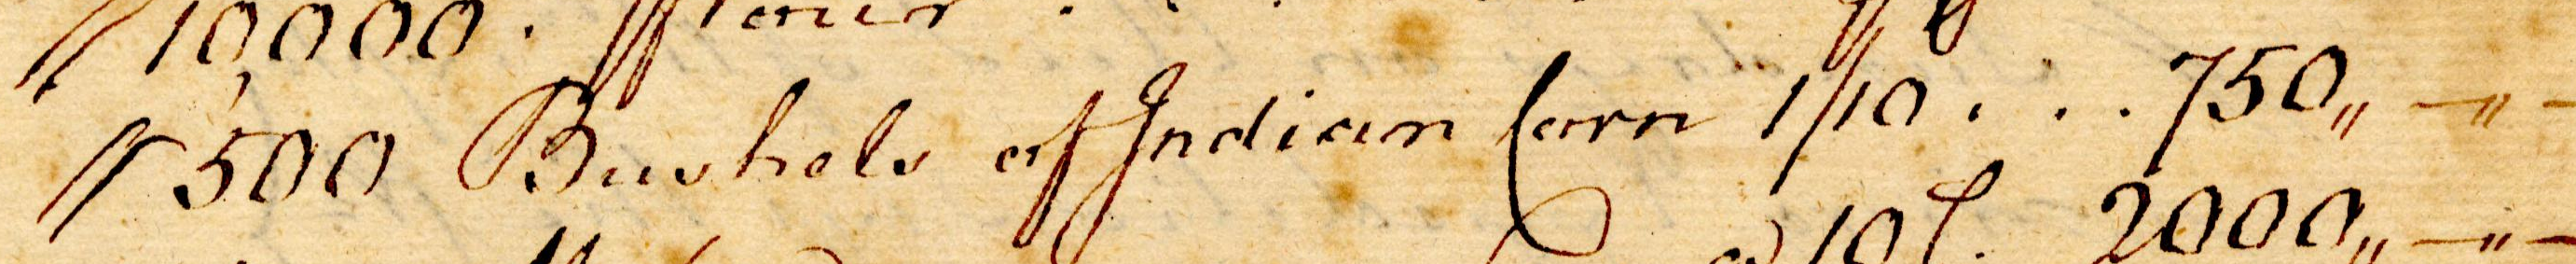500 Bushells of Indian Corn 1s10... 750.-
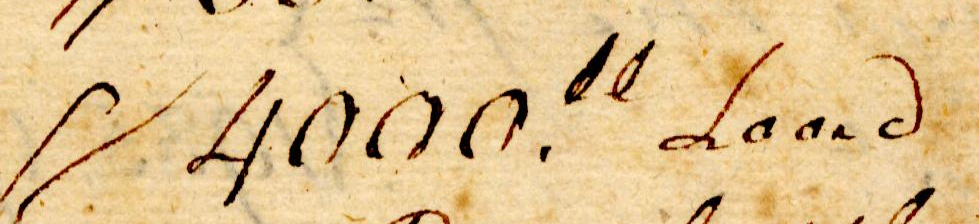4000 ^lb Lard
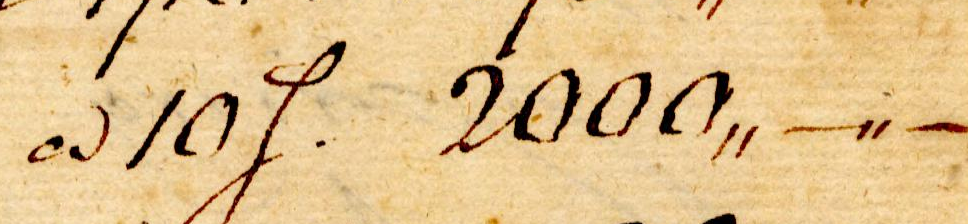@ 10s. 2000..-
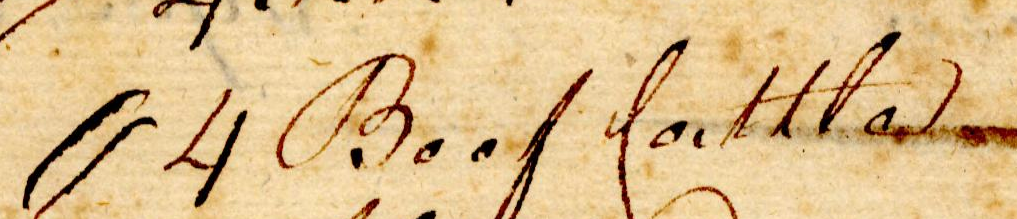4 Beef Cattle
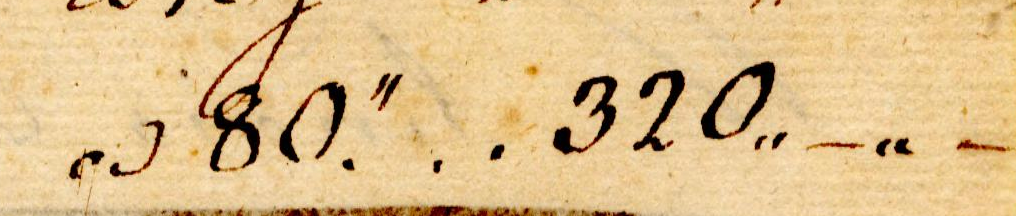@ 80" . . .320..-
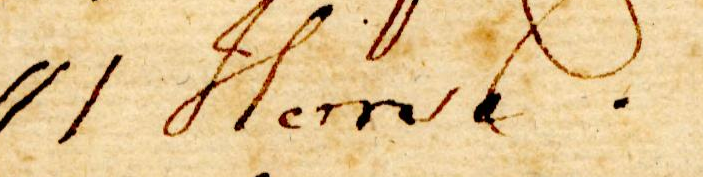1 Horse
